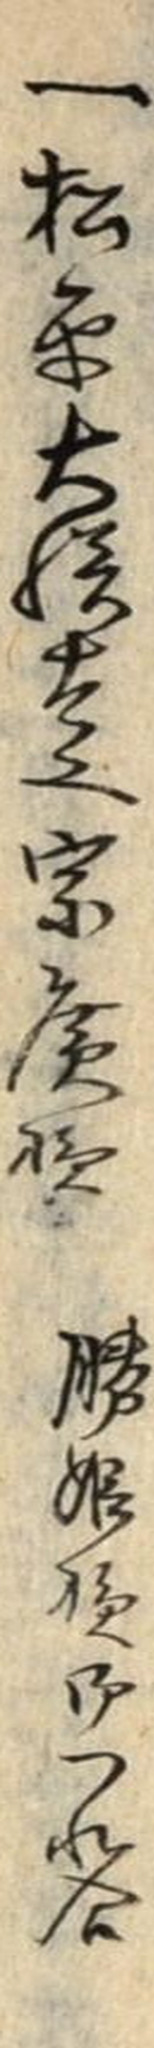一松平大膳大夫宗広様勝姫様御つれ合
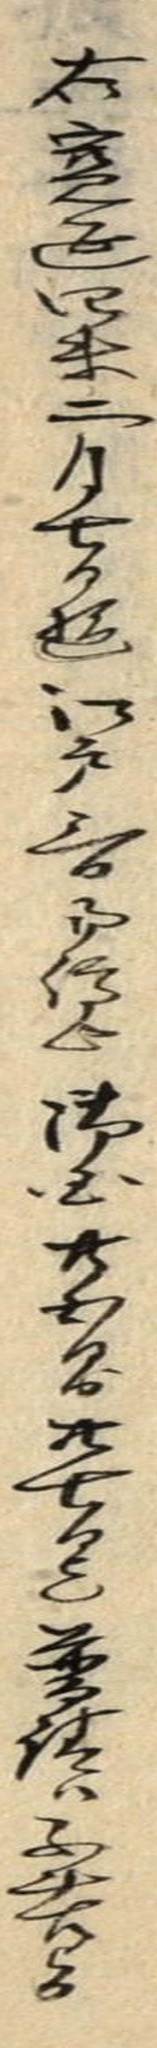右寛延四未二月七日逝江戸三日御停止御国廿五日ゟ廿七日迄普請は不苦旨

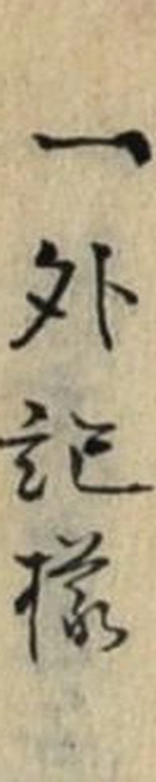一外記様
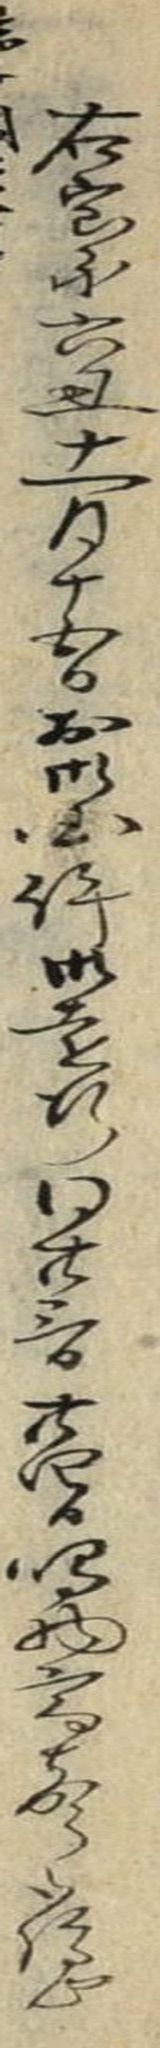右宝永六丑十一月十五日於御国許御遠行同廿三日廿四日鳴物高声御停止
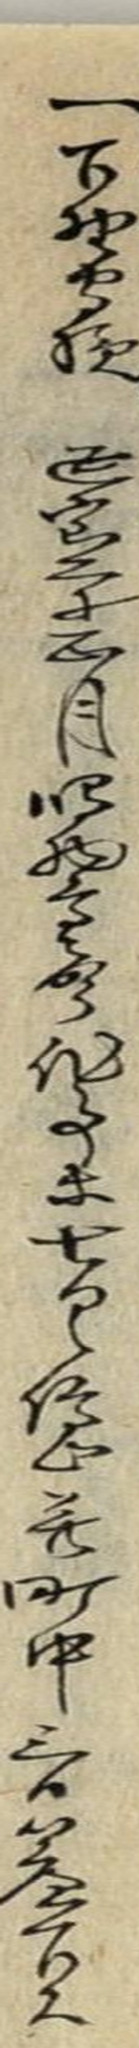一下野守様延宝二刁正月鳴物高声作事等七日之停止并町中三日簾下す
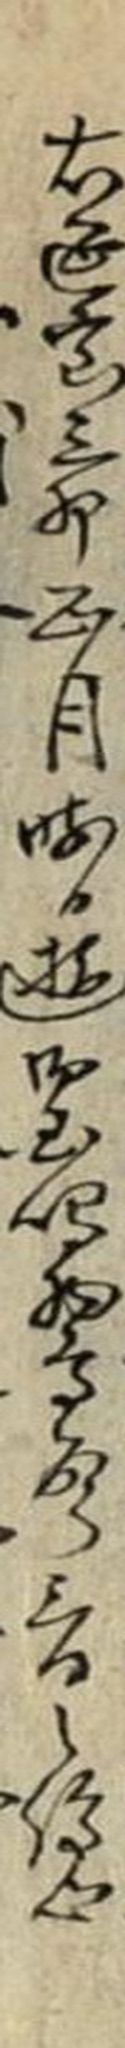右延宝三卯正月晦日逝御国鳴物高声三日之停止
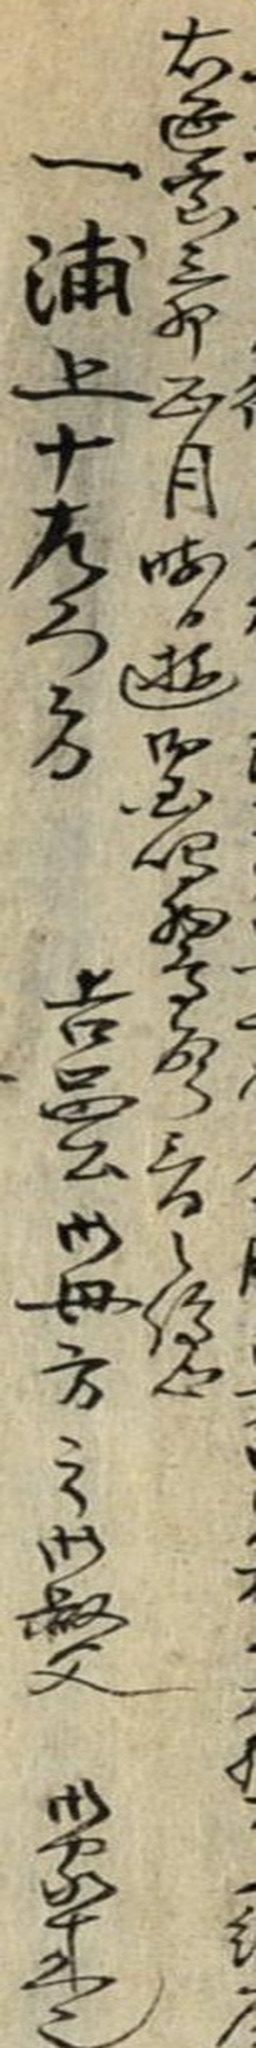一浦上十左衛門方吉品公御母方之御叔父御家来也
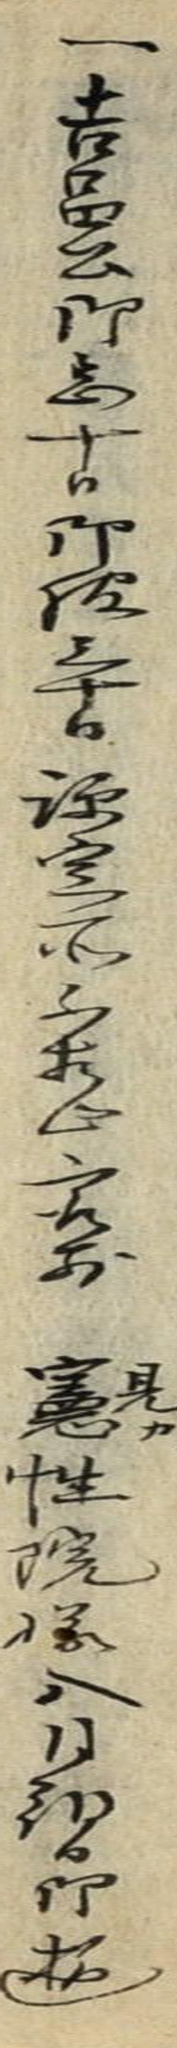一吉品公御忌十日御服三十日評定所不相止最前憲性院様八月朔日御逝
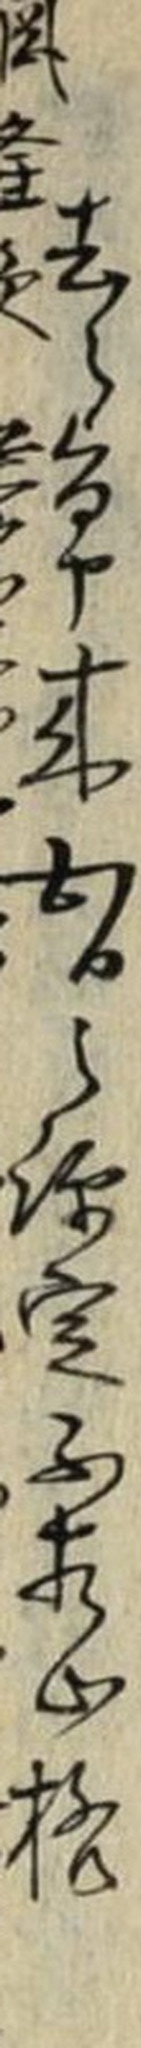去之旨申来五日之評定不相止格
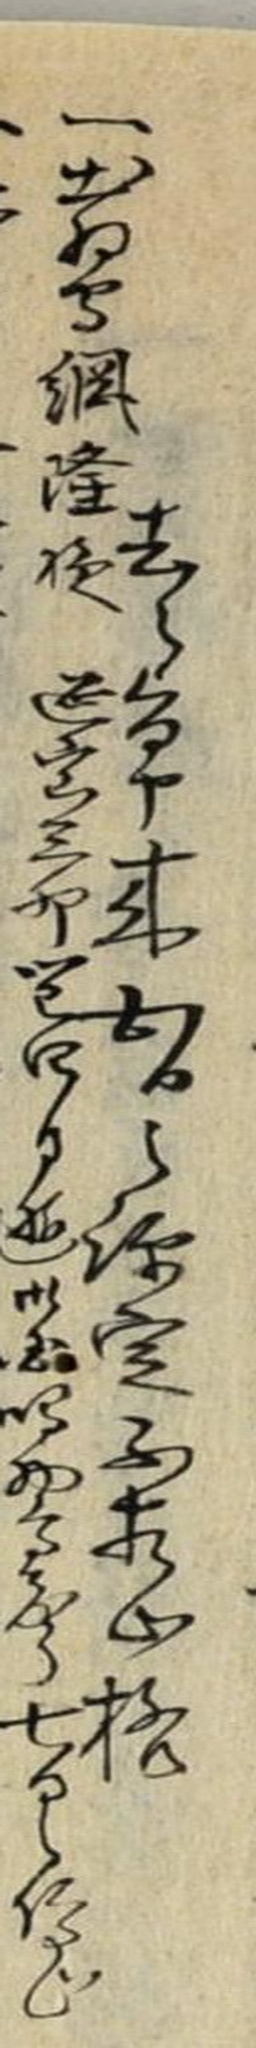一出羽守綱隆様延享三卯閏四月逝御国鳴物高声七日之停止
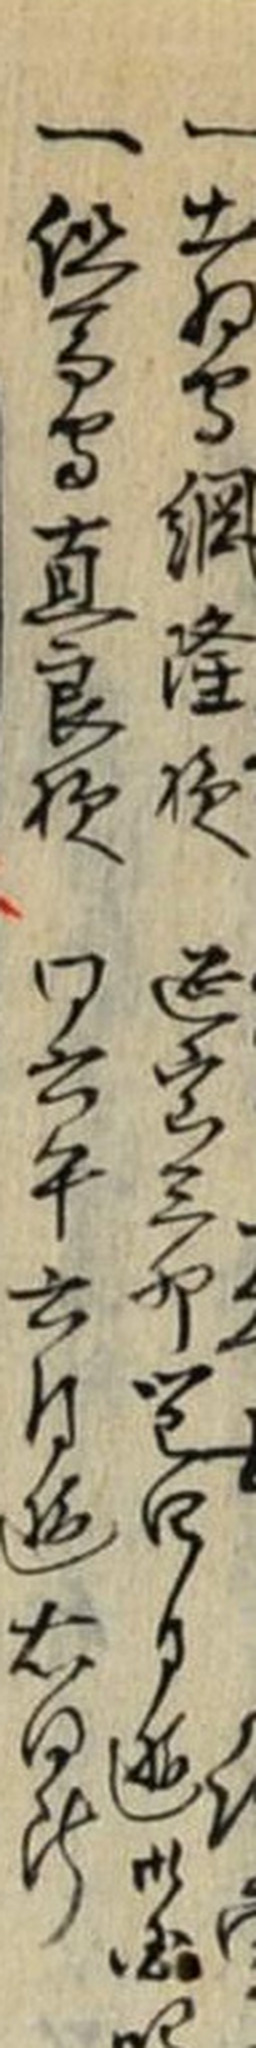一但馬守直良様同六午六月逝右同断
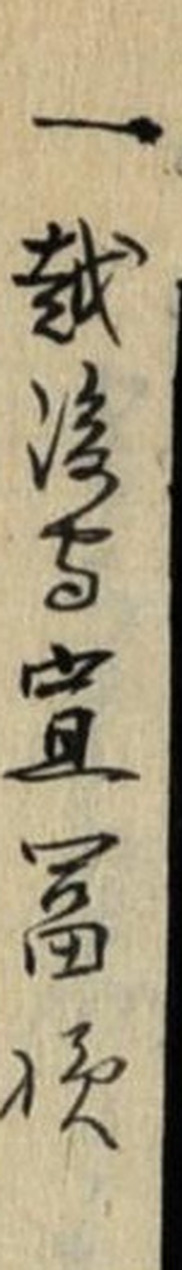一越後守宣富様
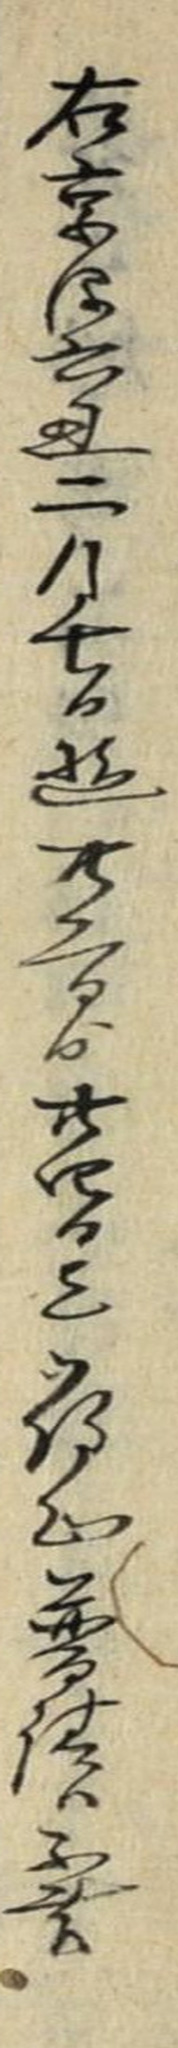右享保六丑二月七日逝廿二日ゟ廿四日迄御停止普請は不苦
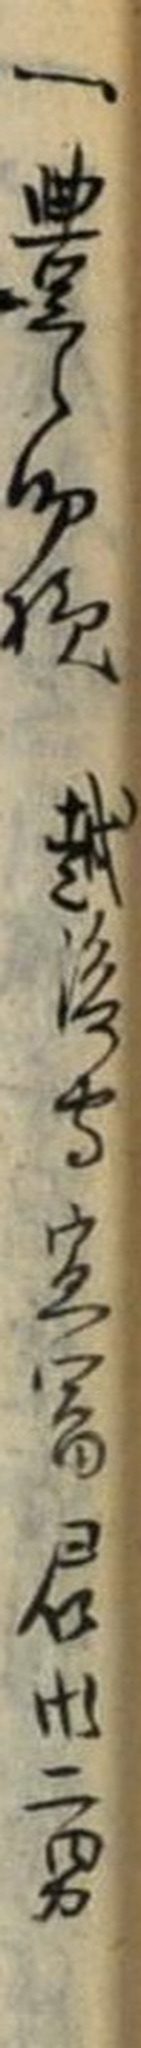一豊之助様越後守宣富君御二男
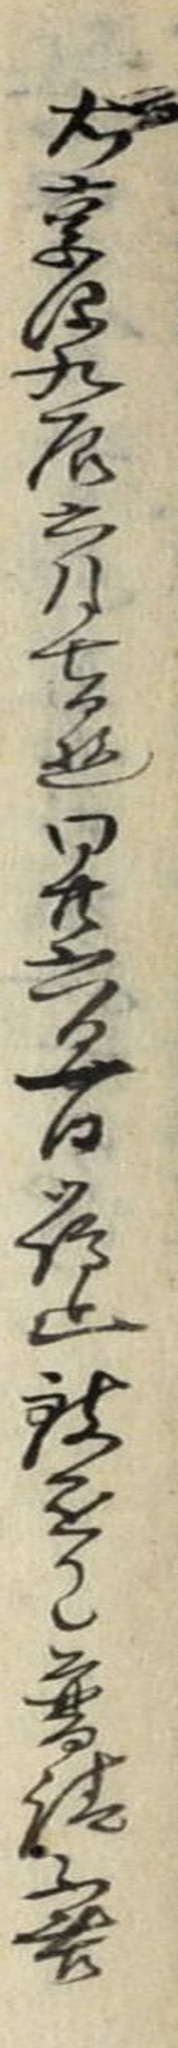右享保九辰六月七日逝同廿六日一日御停止致懸り之普請不苦
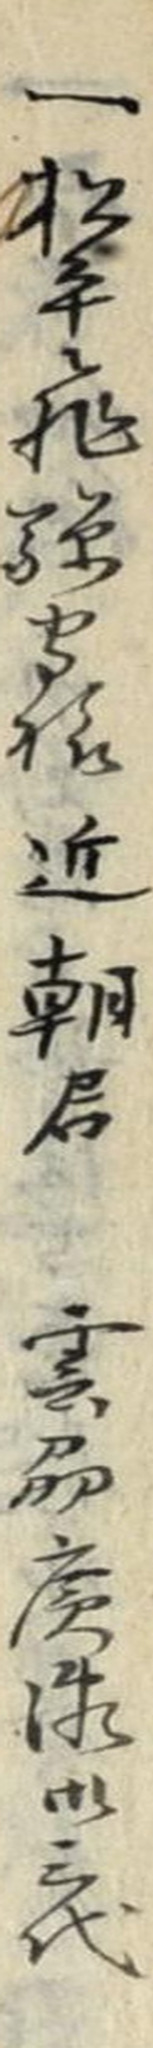一松平飛騨守様近朝君雲州広瀬御三代
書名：御停止異変死失
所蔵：福井県文書館 Fukui Prefectural Archives
